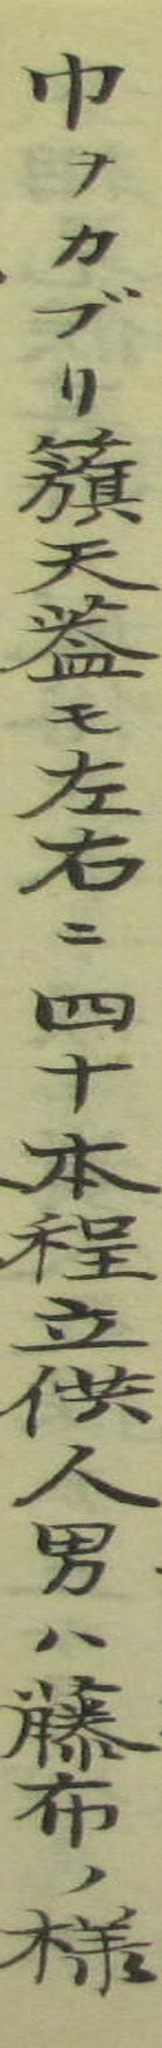巾ヲカブリ籏天蓋モ左右ニ四十本程立供人男ハ藤布ノ様
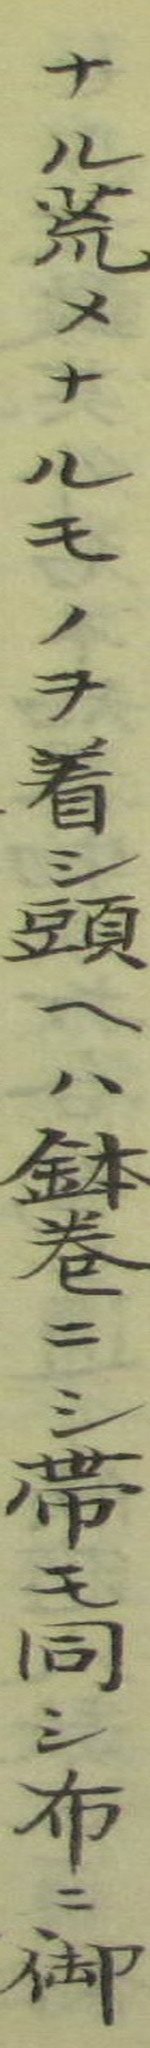ナル荒メナルモノヲ着シ頭ヘハ鉢巻ニシ帯モ同シ布ニ御
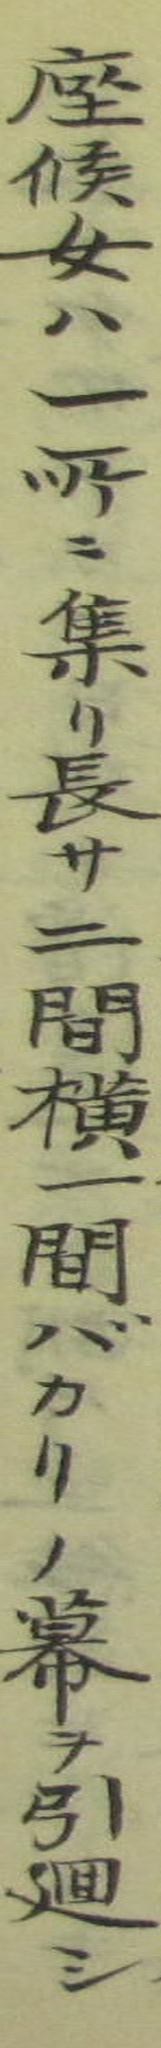座候女ハ一所ニ集リ長サ二間横一間バカリノ幕ヲ引廻シ
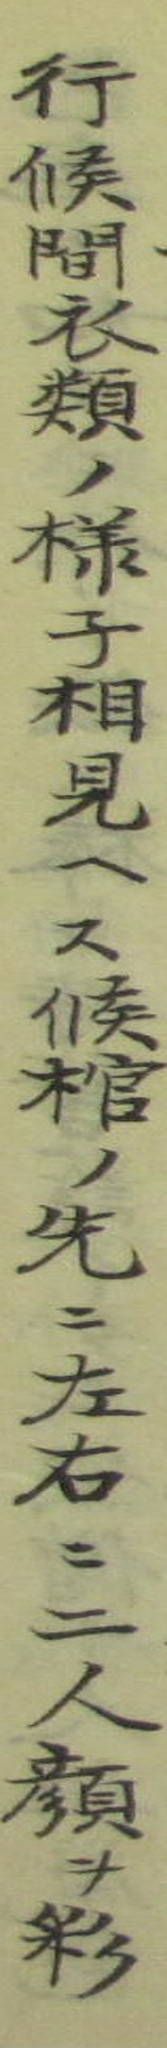行候間衣類ノ様子相見ヘス候棺ノ先ニ左右ニ二人顔ヲ彩

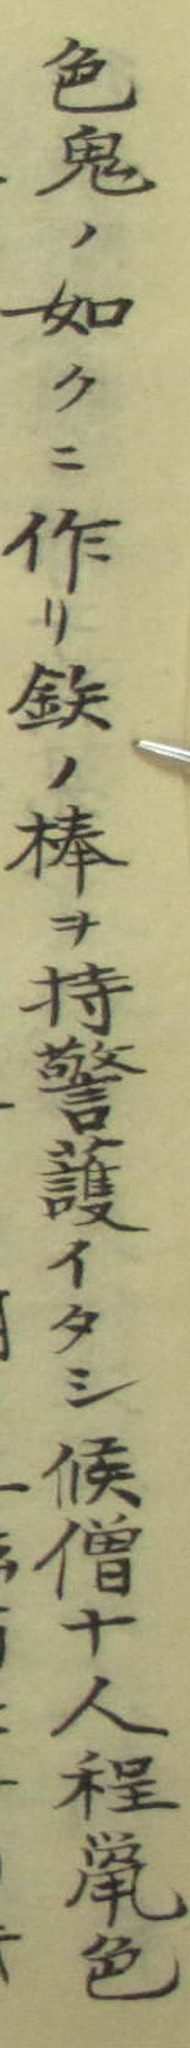色鬼ノ如クニ作リ鉄ノ棒ヲ持警護イタシ候僧十人程鼠色
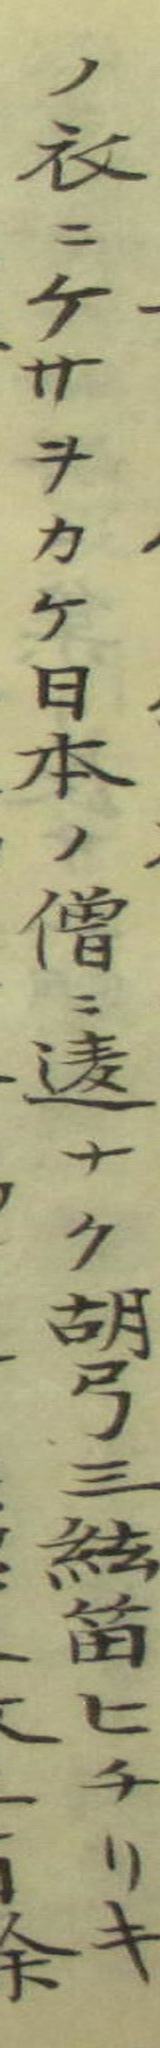ノ衣ニケサヲカケ日本ノ僧ニ違ナク胡弓三絃笛ヒチリキ
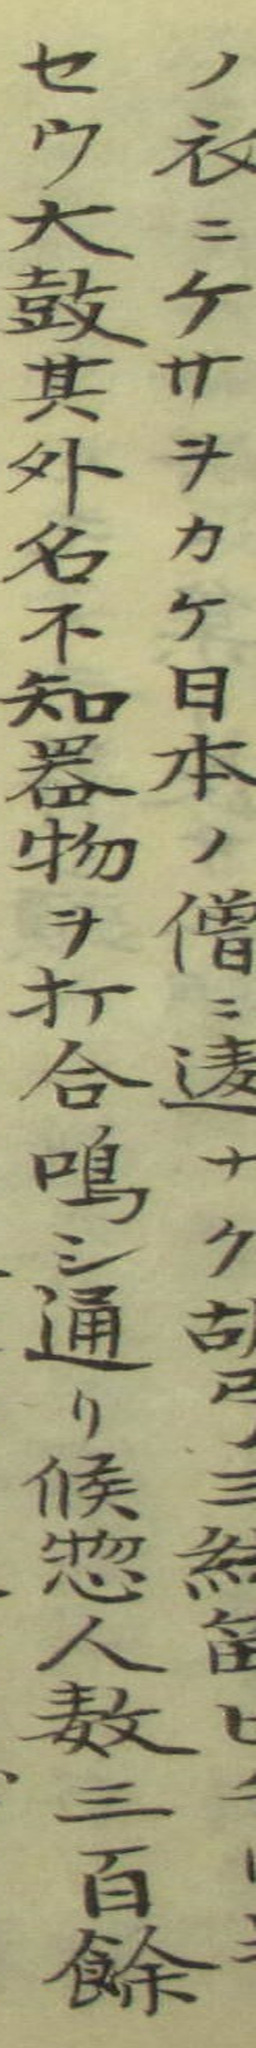セウ大鼓其外名不知器物ヲ打合鳴シ通リ候惣人数三百餘
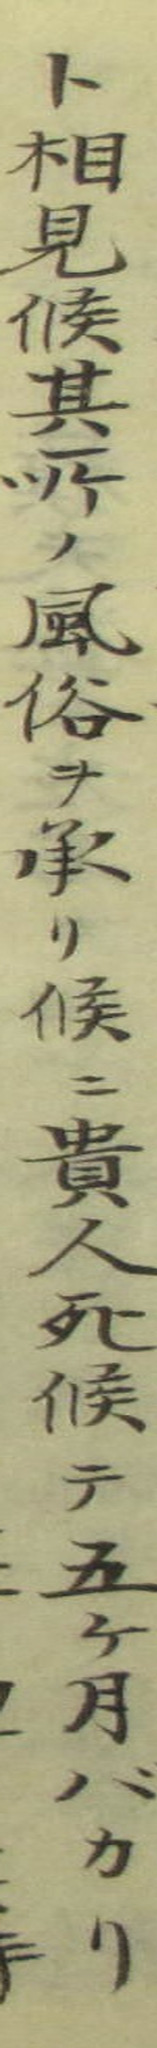ト相見候其所ノ風俗ヲ承リ候ニ貴人死候テ五ヶ月バカリ
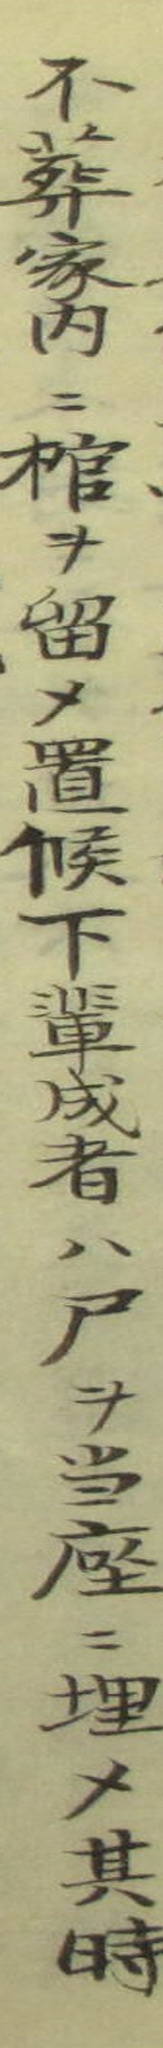不葬家内ニ棺ヲ留メ置候下輩成者ハ尸ヲ当座ニ埋メ其時
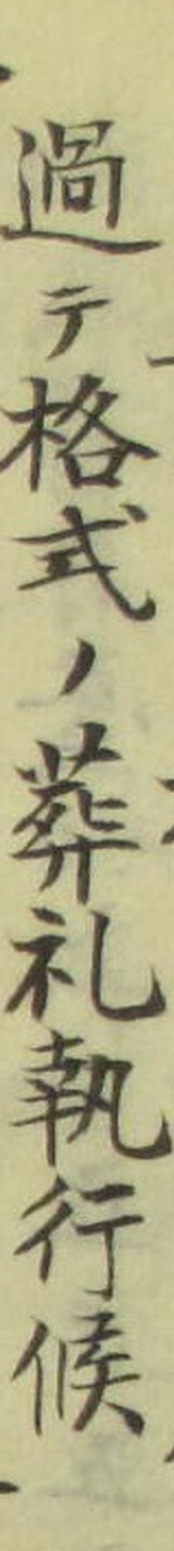過テ格式ノ葬礼執行候
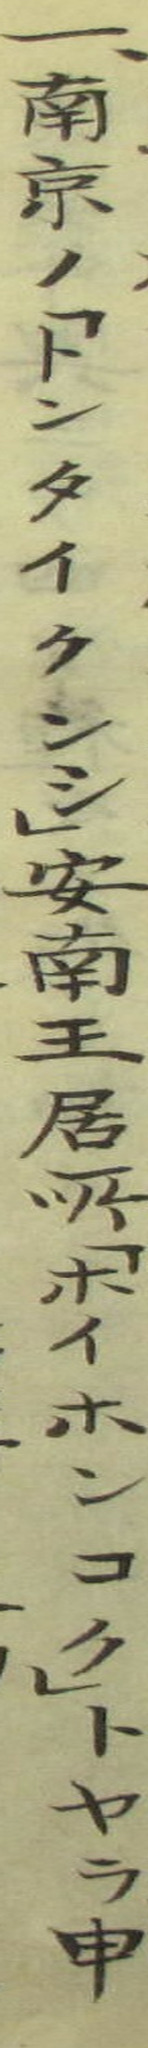一南京ノ「トンタイクンシ」安南王居所「ホイホンコク」トヤラ申
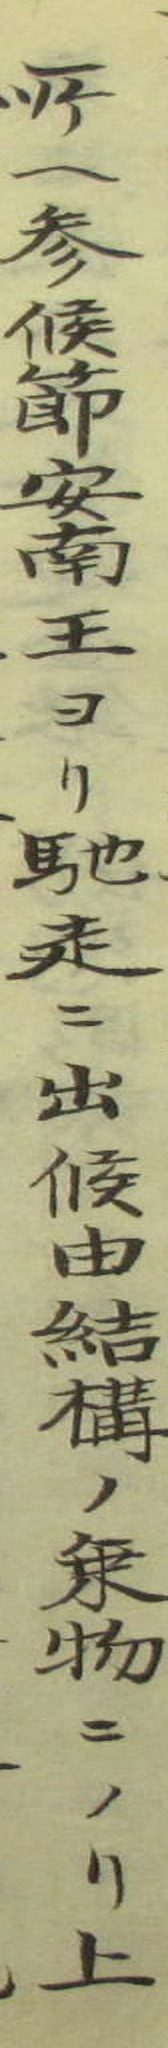所へ参候節安南王ヨリ馳走ニ出候由結構ノ乗物ニノリ上
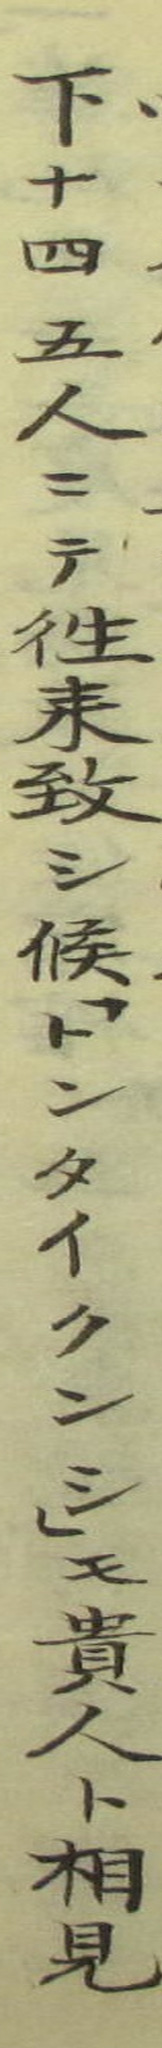下十四五人ニテ往来致シ候「トンタイクンシ」モ貴人ト相見
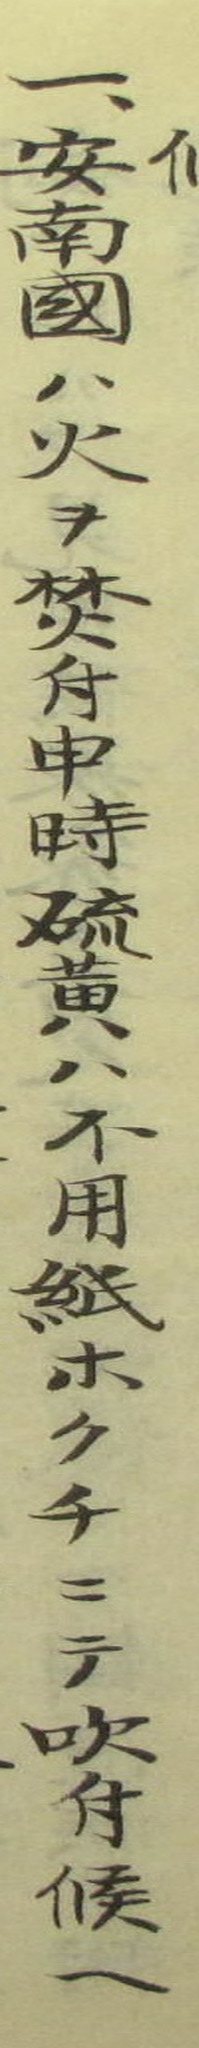一安南國ハ火ヲ焚付申時硫黄ハ不用紙ホクチニテ吹付候ヘ
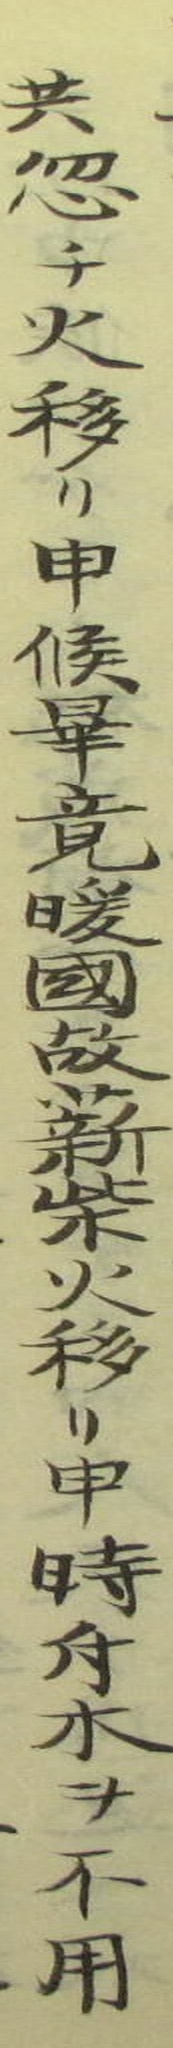共忽チ火移リ申候畢竟暖国故薪柴火移リ申時付木ヲ不用
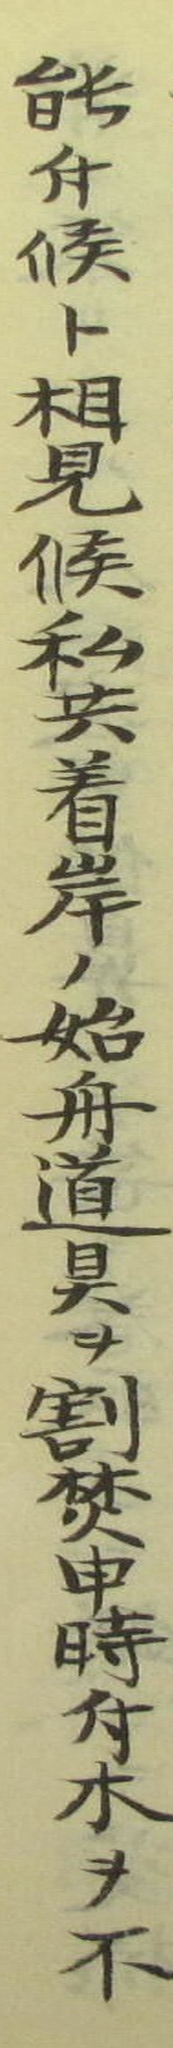能付候ト相見候私共着岸ノ始舟道具ヲ割焚申時付木ヲ不
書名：異国船漂着記 外二
